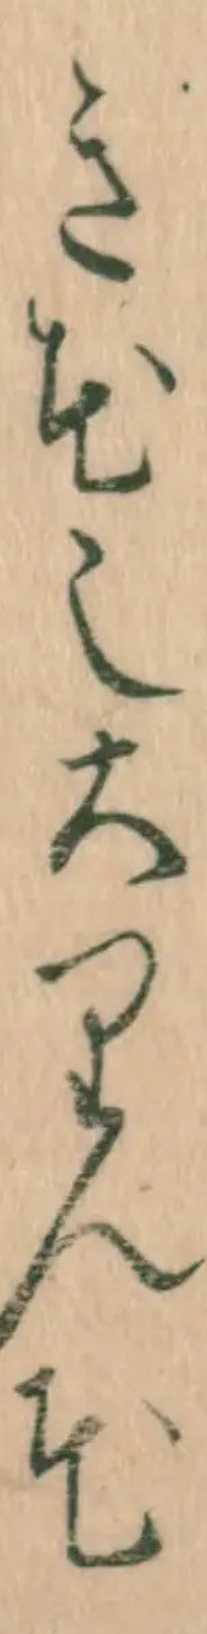き花也大りん花
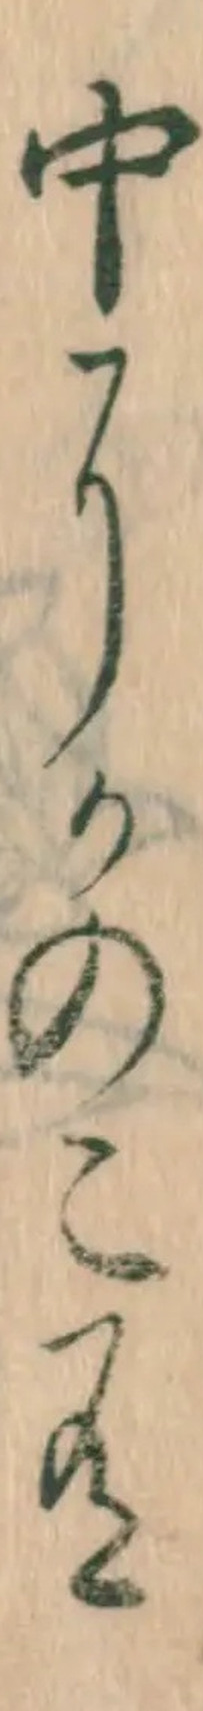中にかのこ有
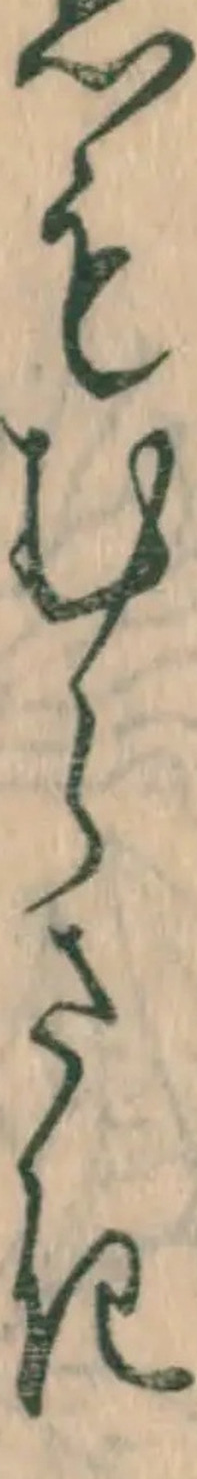しもむらさき
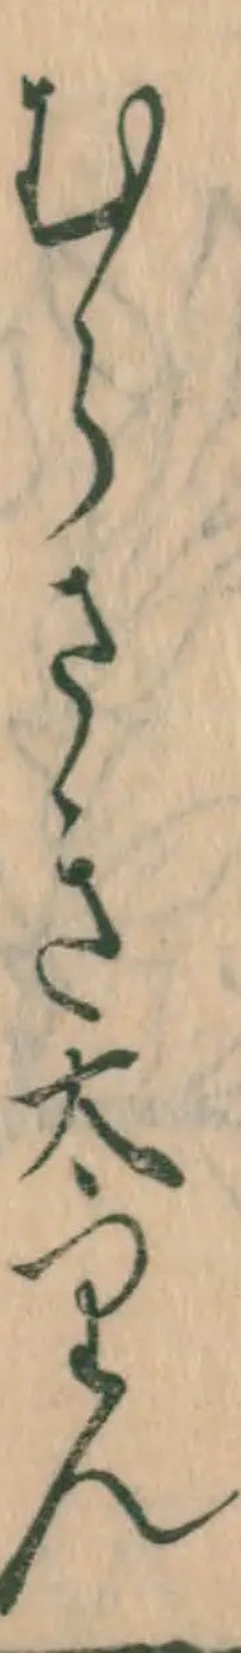むらさき太りん
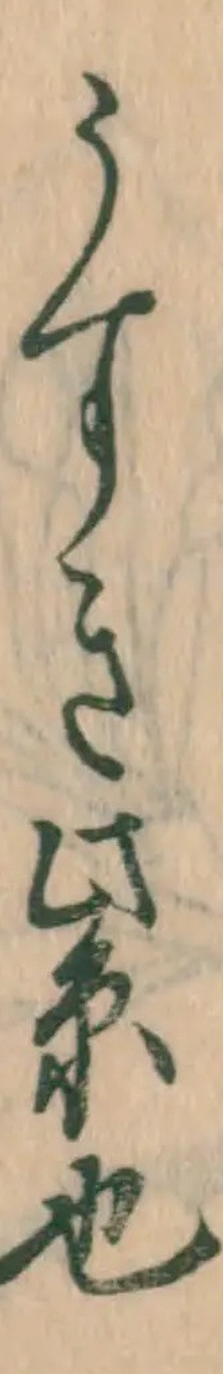うすき紫也
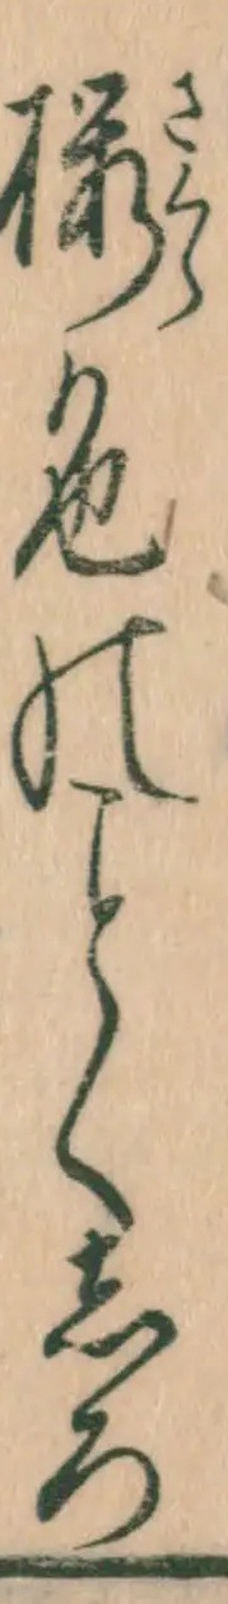桜色のことくしろ
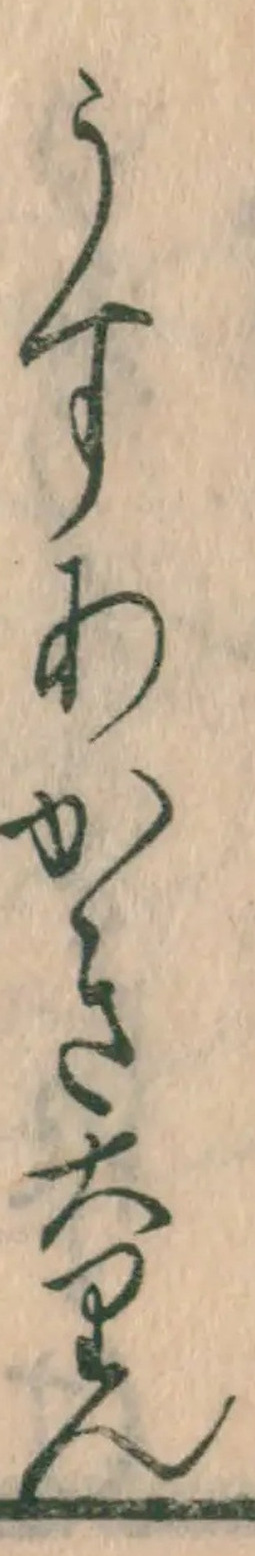うすあかき大りん
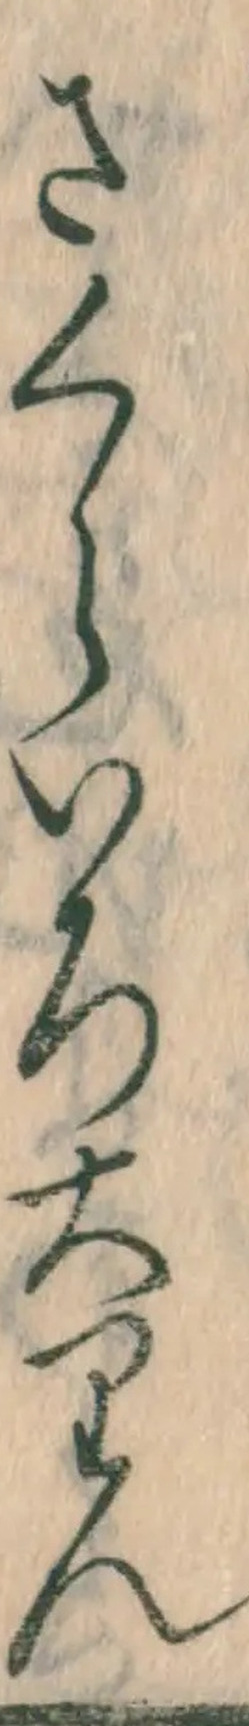さくらいろ大りん
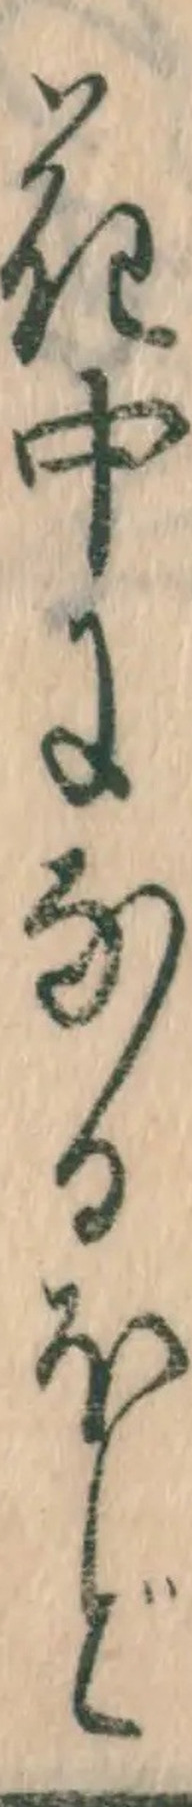花中になるほど
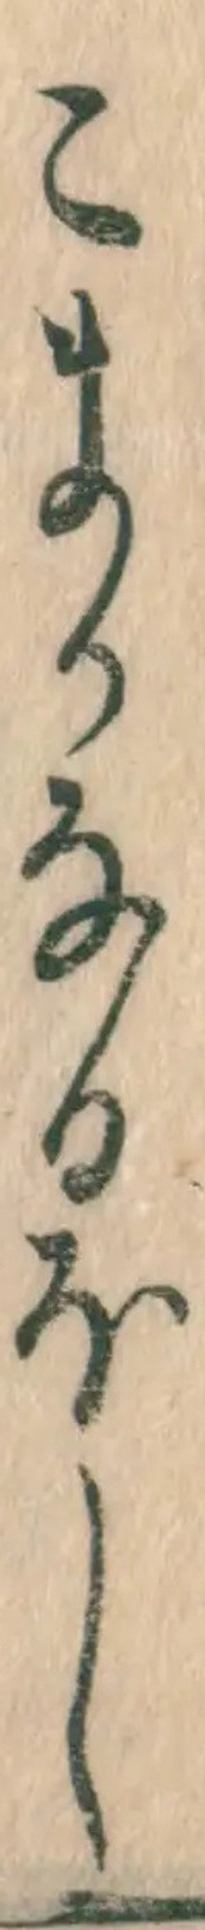こまかなるほし
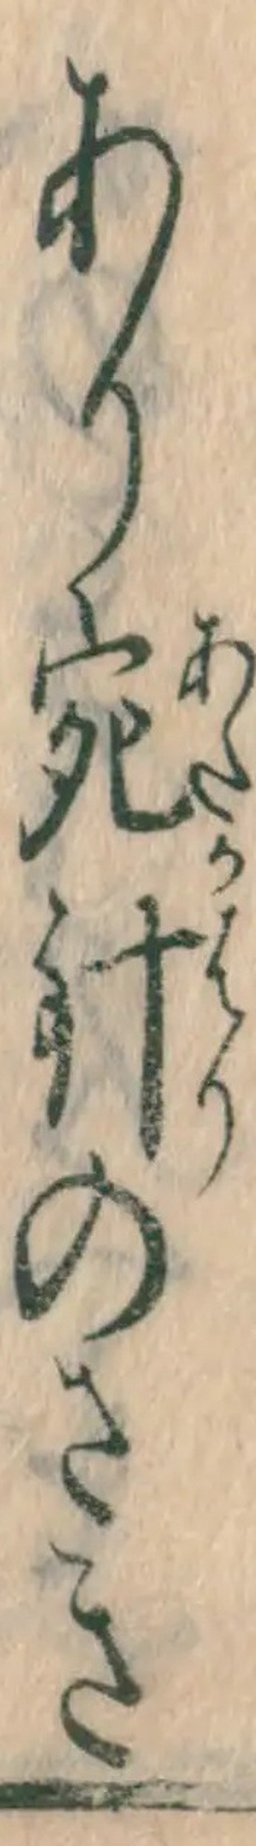あり宛針のさき
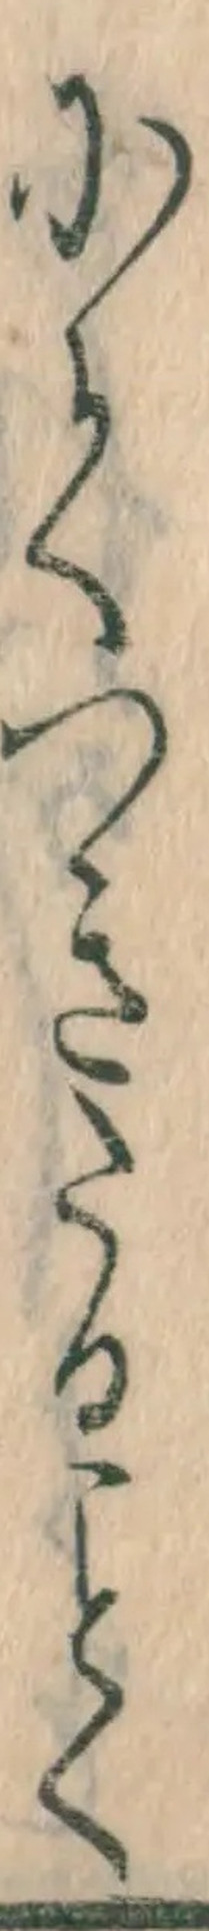にてつきたることく

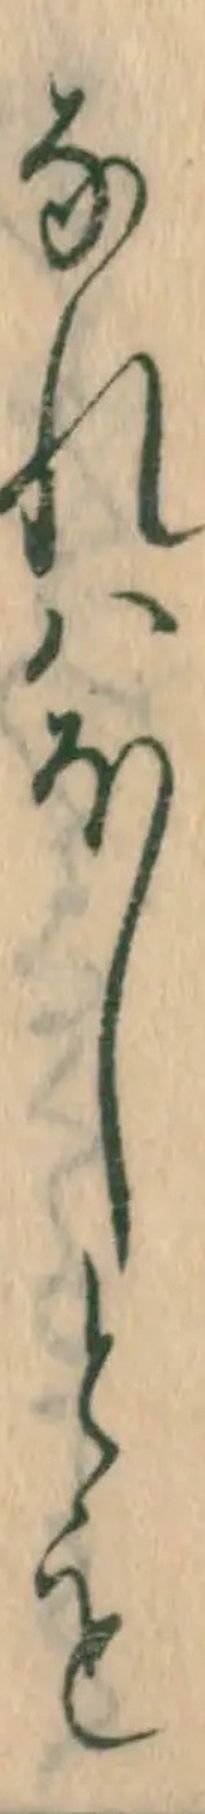なれはほしとも
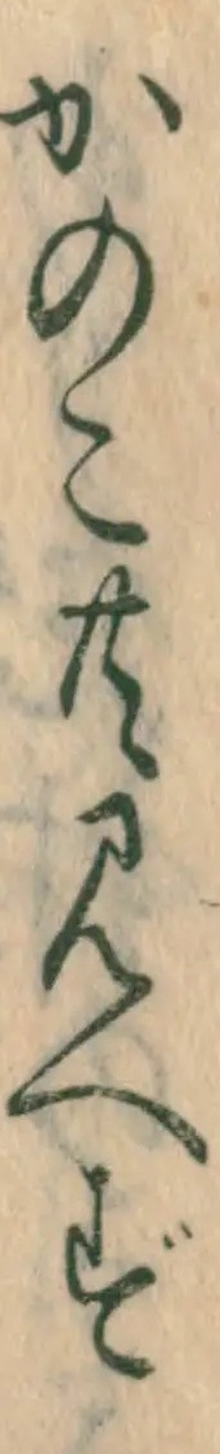かのこ共見へず
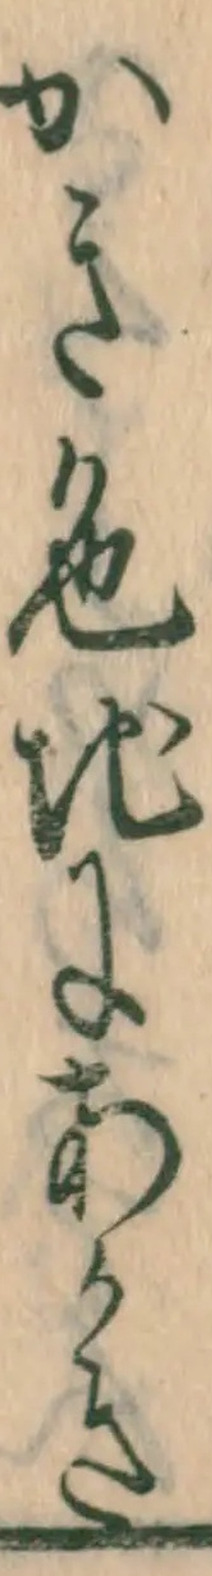かき色地にあかき
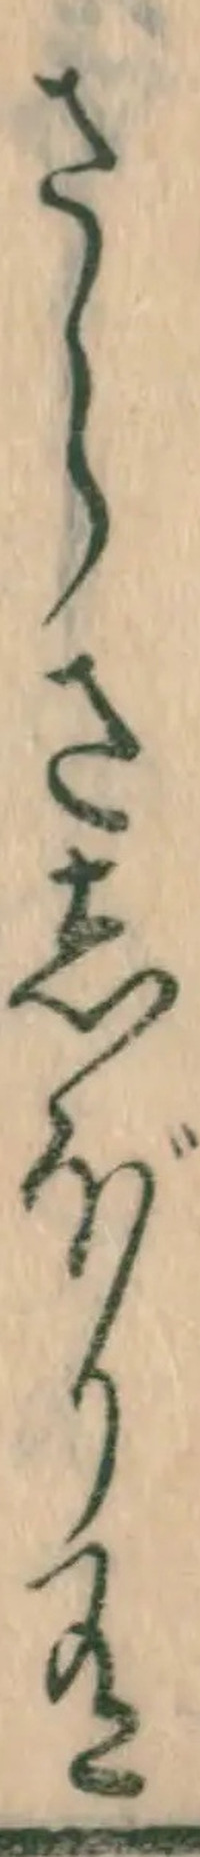さらさしぼり有
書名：錦繍枕 5巻. [4]
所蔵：国立国会図書館 National Diet Library, JAPAN
